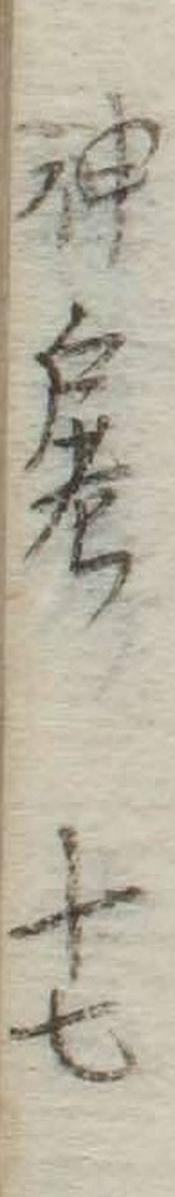神戸考十七

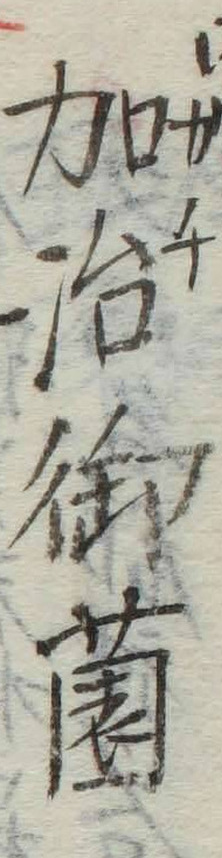加治御薗
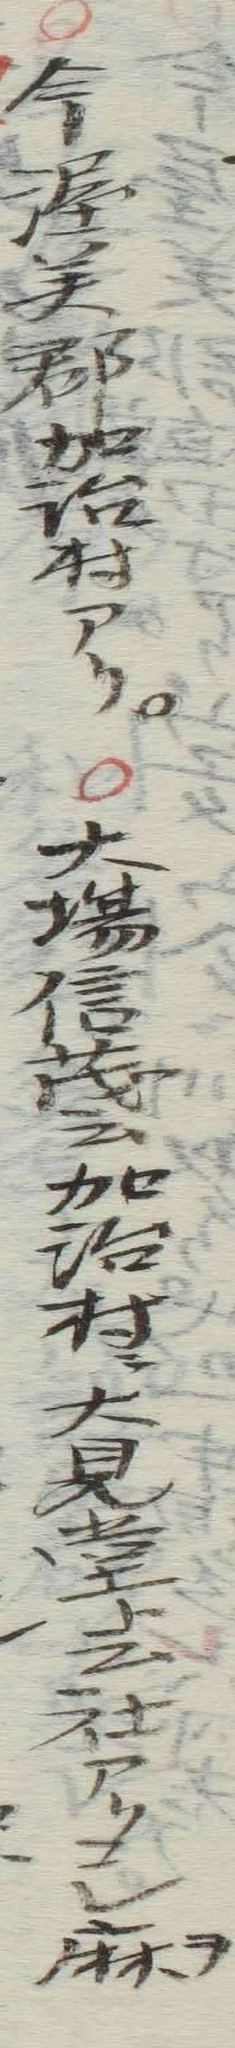○今渥美郡加治村アリ。○大場信茂云加治村ニ大見堂ト云社アリコレ麻
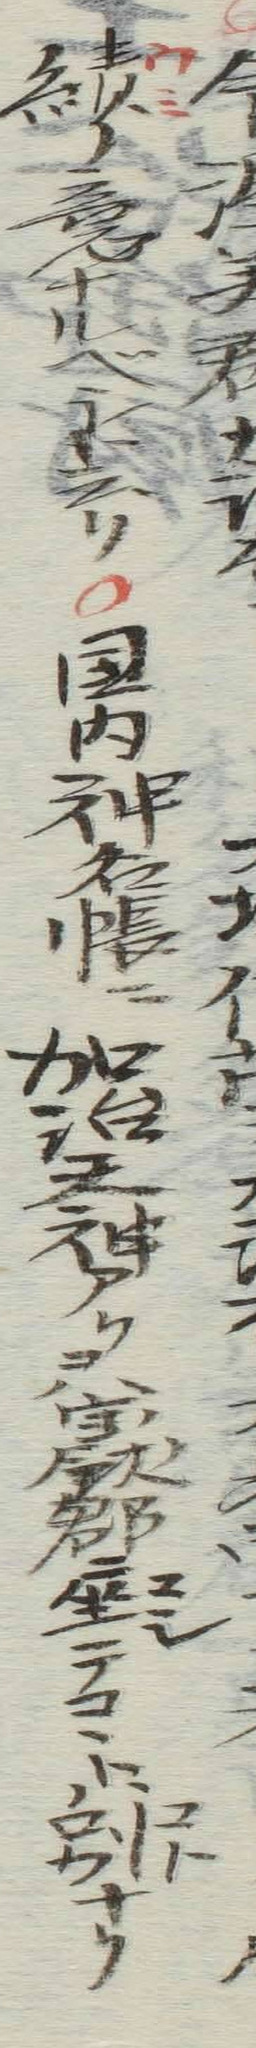績ノ意ナルベシト云リ○国内神名帳ニ加治天神アリコハ八宝飫郡ニ坐テコヽトハ別ナリ
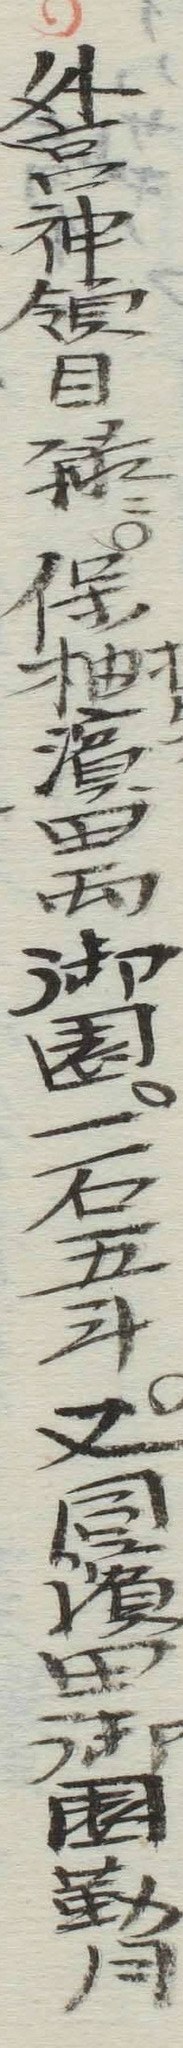○外宮神領目録。保柚濱田両御園。一石五斗。又同濱田御園勤月
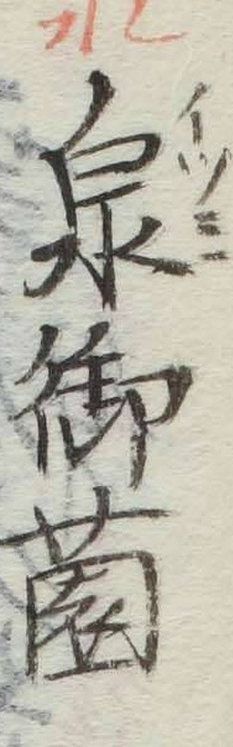泉御薗
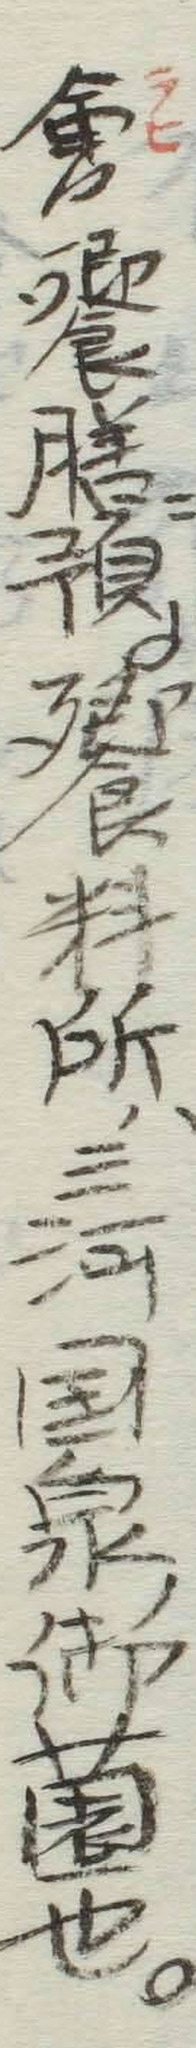会饗膳預ル。饗料所ハ三河国泉御薗也。
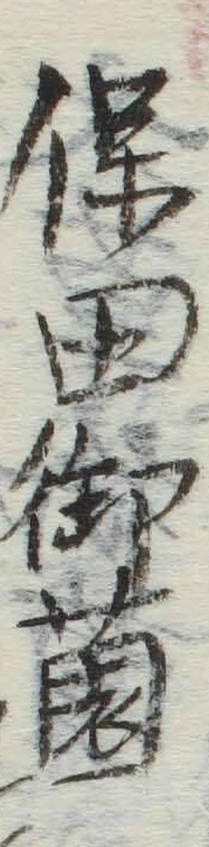保田御薗
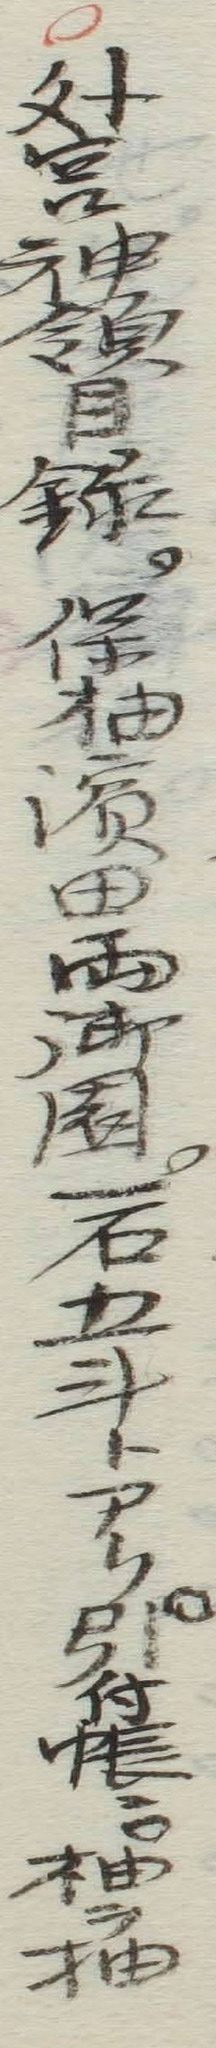○外宮神領目録。保柚濱田両御園。一石五斗トアリ。引付帳ニ。柚ヲ抽
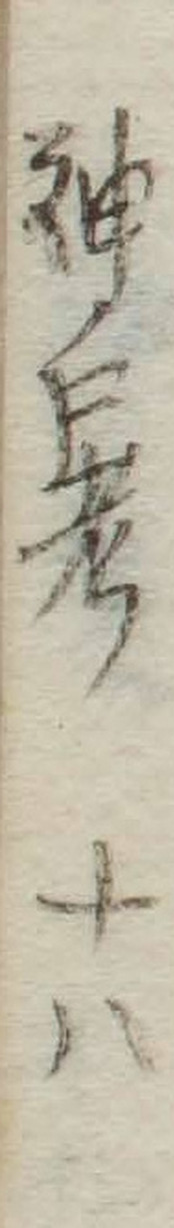神戸考十八

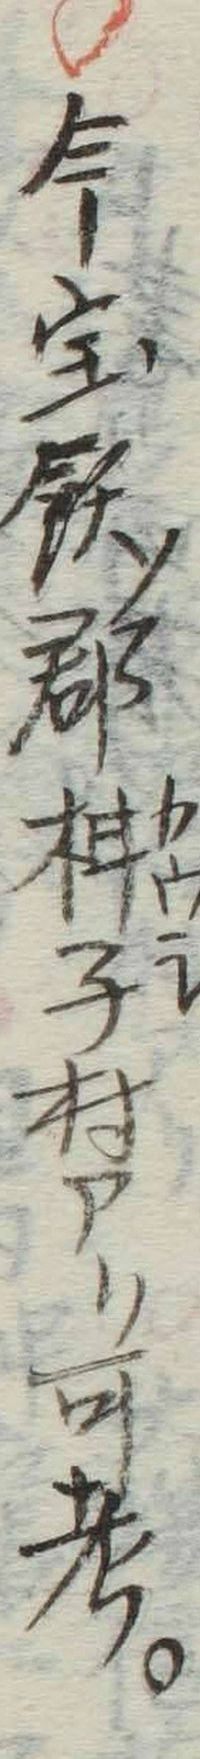○今宝飫郡柚子村アリ可考。
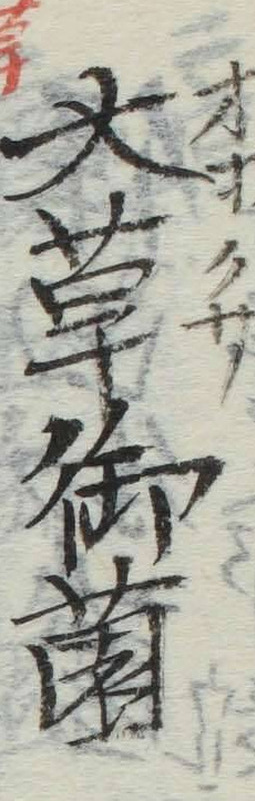大草御薗
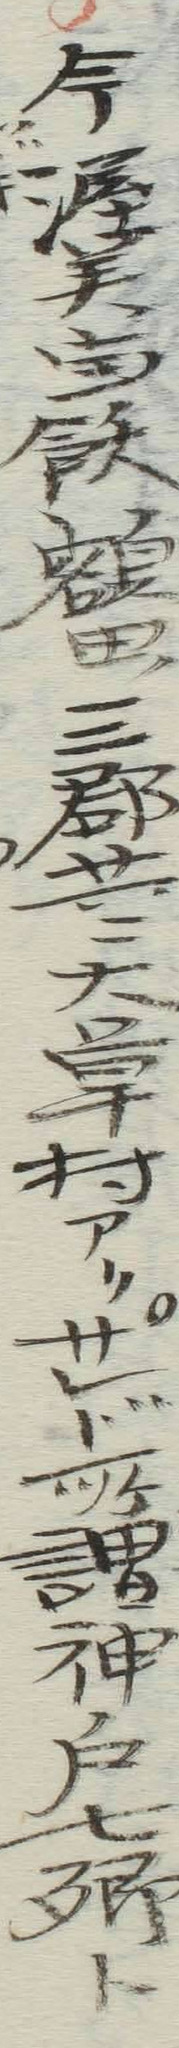○今渥美宝飫額田三郡共ニ大草村アリ。サレド所謂神戸七郷ト
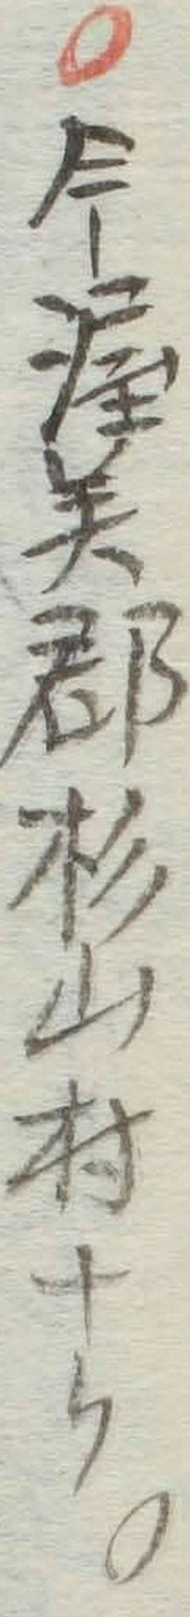○今渥美郡杉山村ナリ。

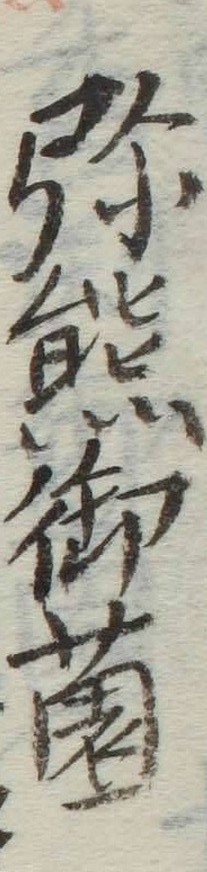弥熊御薗
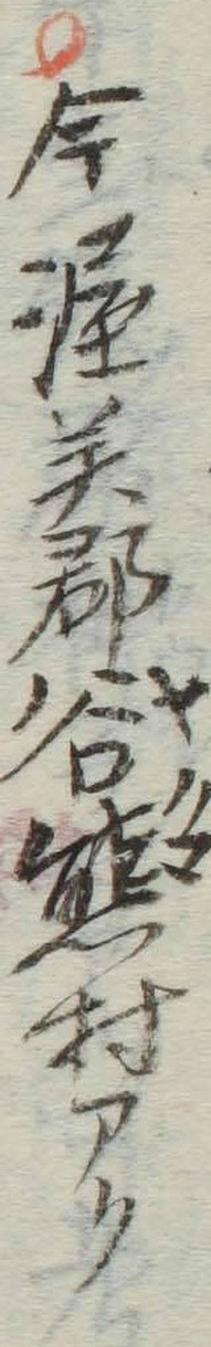○今渥美郡谷熊村アリ
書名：神戸御厨御薗考
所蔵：国文学研究資料館
